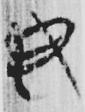母（毋）
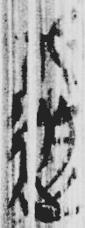從
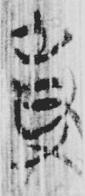事
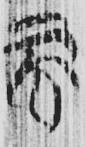而
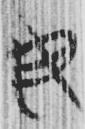母（毋）
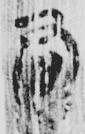君
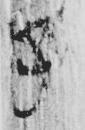子
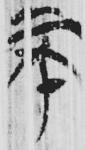不
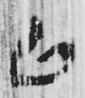㠯（以）
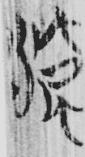流
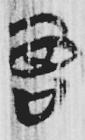言
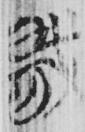○（傷）
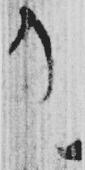人
